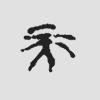天
